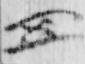五
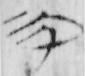帀（師）
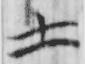士
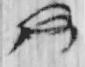尹
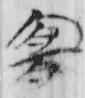宜
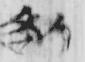咎
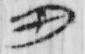甲
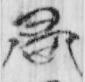晨
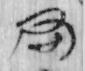君
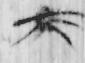夫
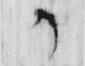人
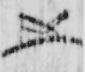之
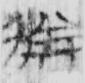劵
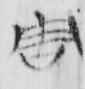周
